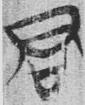君
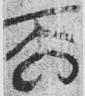而
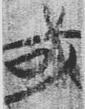或
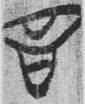言
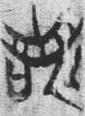若
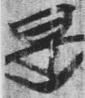是
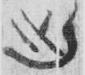此
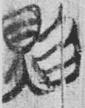則
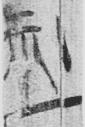社
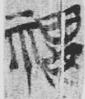禝（稷）
